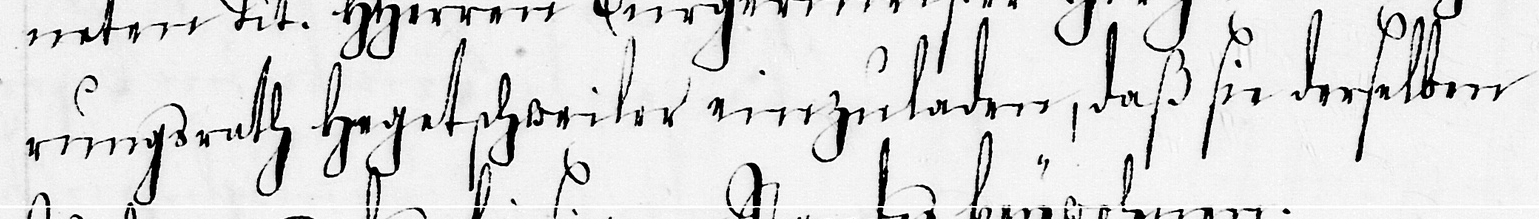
rungsrath Hegetschweiler einzuladen, daß sie derselben
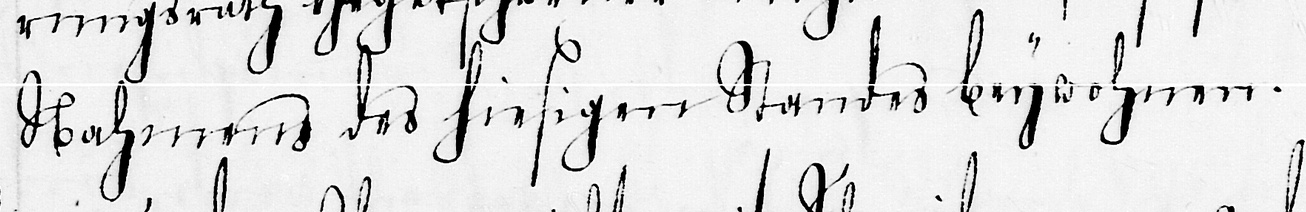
Nahmens des hiesigen Standes beywohnen.
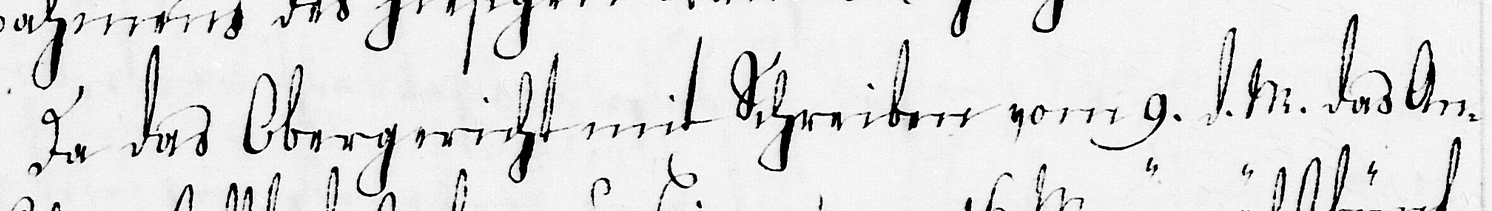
Da das Obergericht mit Schreiben vom 9. d. M. das An¬
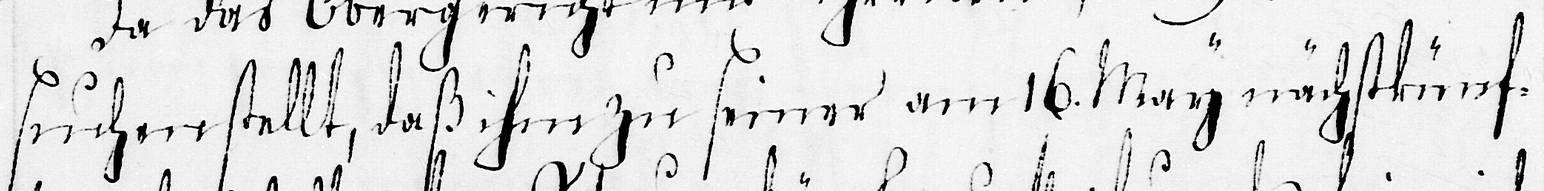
suchen stellt, daß ihm zu seiner am 16. März nächstkünf¬
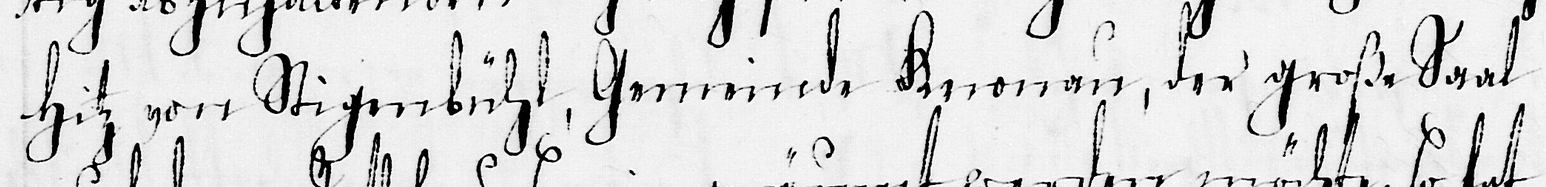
Hitz von Stigenbühl, Gemeinde Knonau, der große Saal
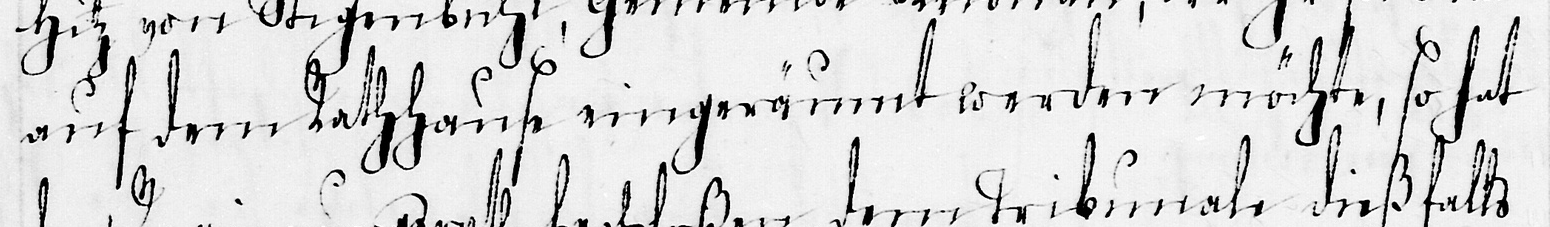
auf dem Rathhause eingeräumt werden möchte, so hat
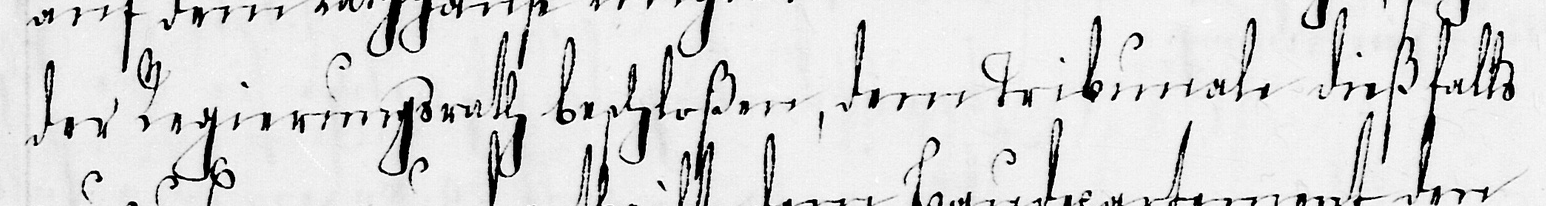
der Regierungsrath beschloßen, dem Tribunale dießfalls
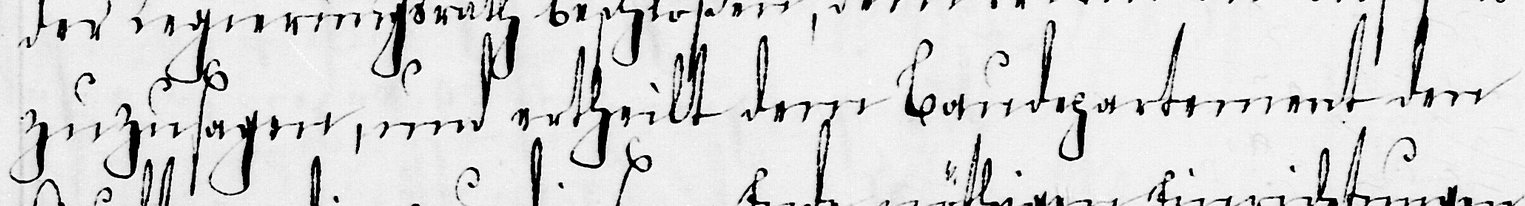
zuzusagen, und ertheilt dem Baudepartement den
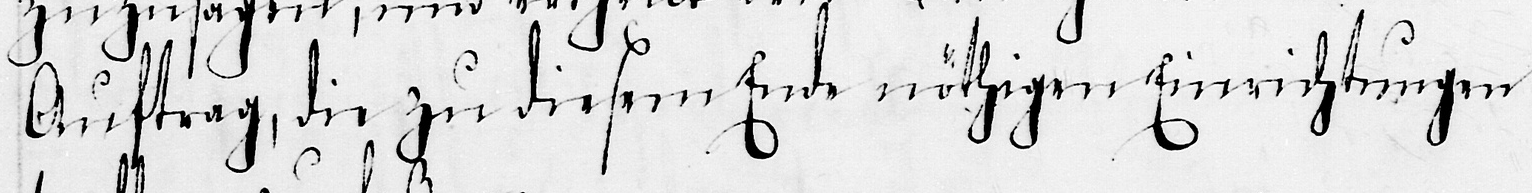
Auftrag, die zu diesem Ende nöthigen Einrichtungen
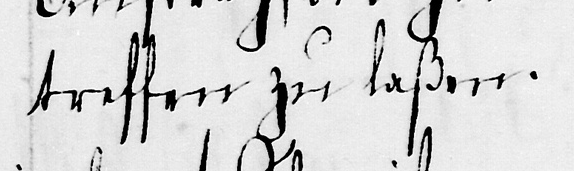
treffen zu laßen.
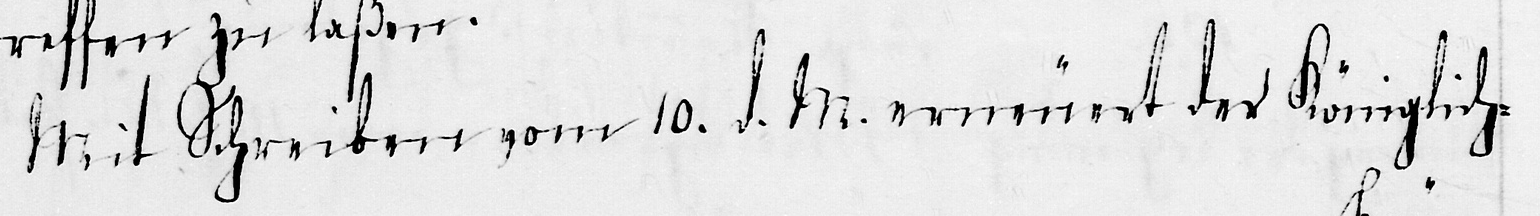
Mit Schreiben vom 10. d. M. erneuert der Königlich-
